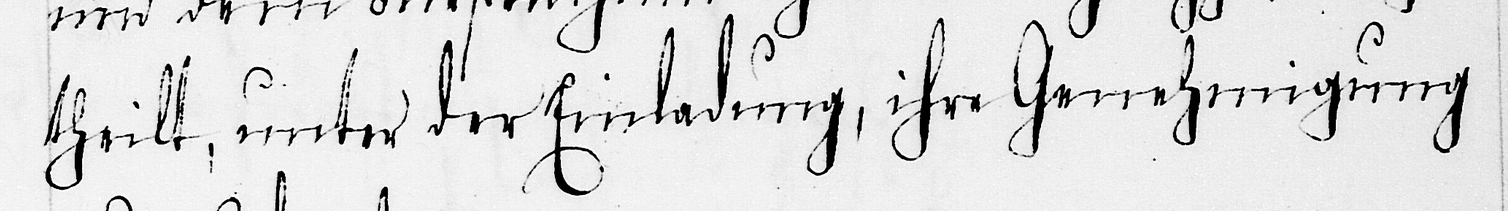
theilt, unter der Einladung, ihre Genehmigung
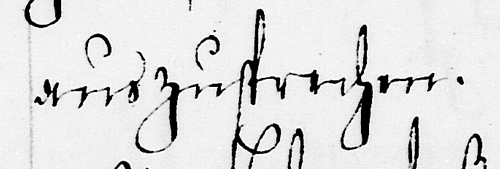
auszusprechen.
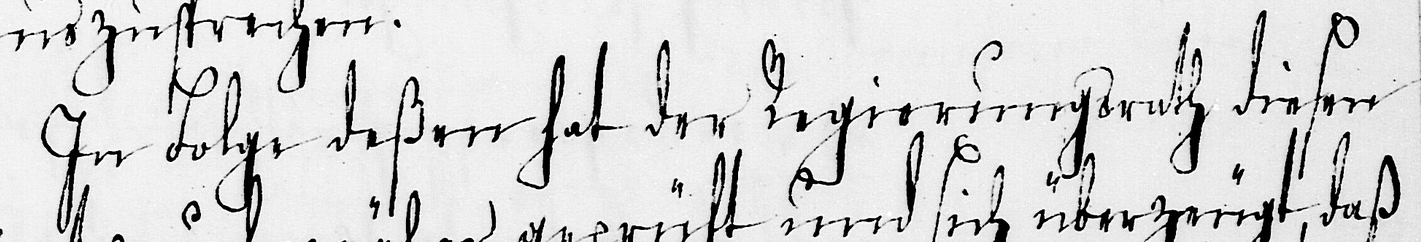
In Folge deßen hat der Regierungsrath diesen
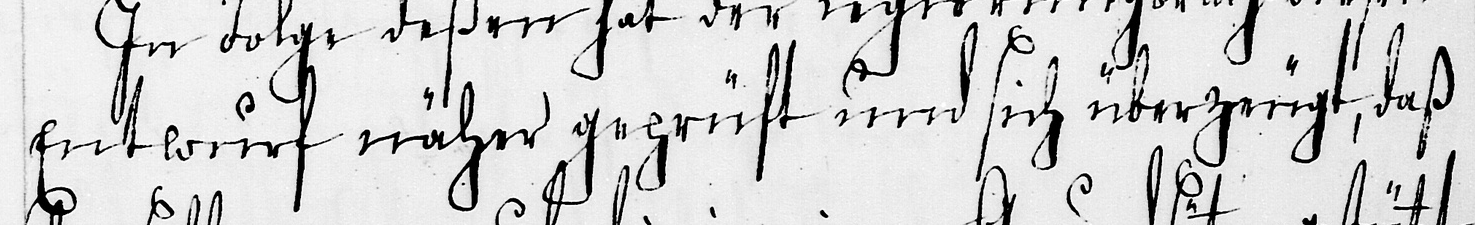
Entwurf näher geprüft und sich überzeugt, daß
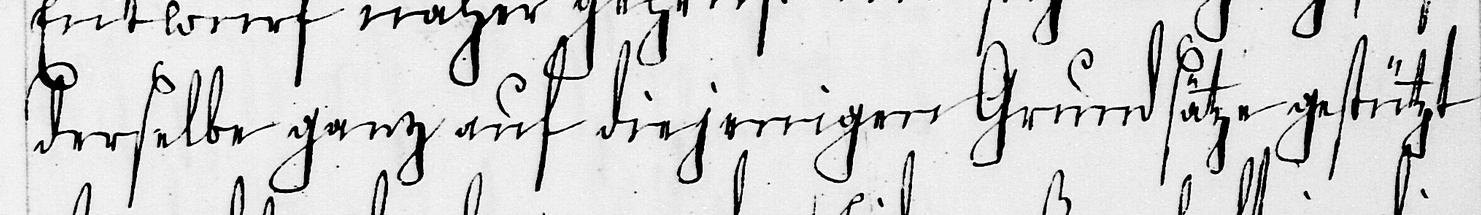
derselbe ganz auf diejenigen Grundsätze gestützt
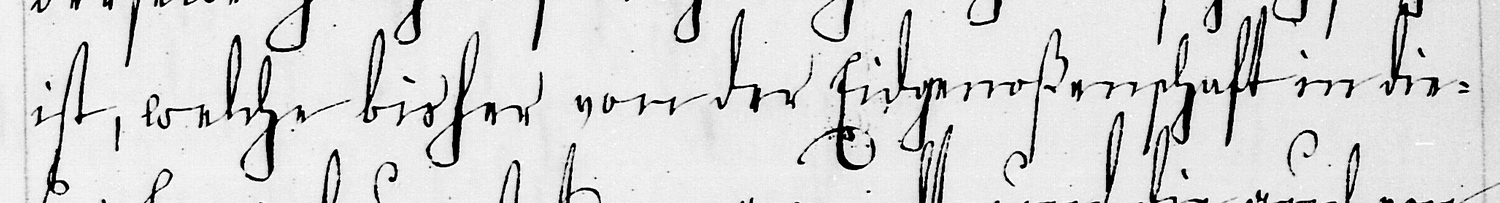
ist, welche bisher von der Eidgenoßenschaft in die¬
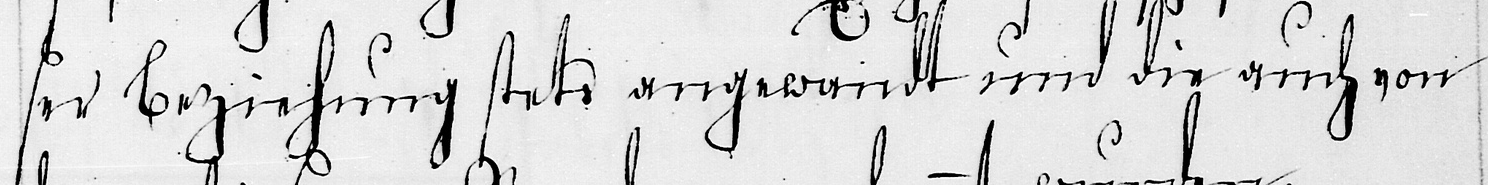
ser Beziehung stets angewandt und die auch von
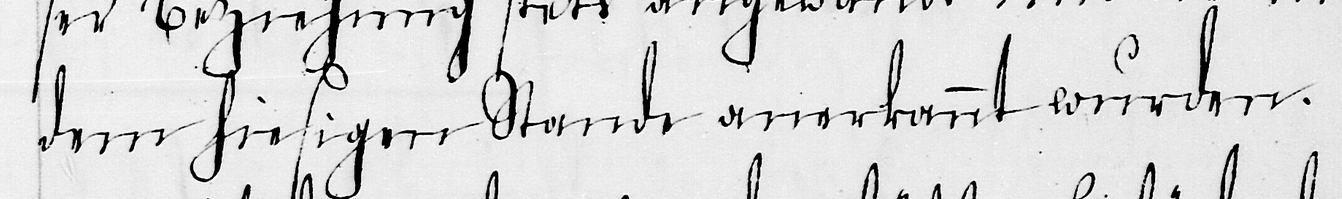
dem hiesigen Stande anerkannt wurden.
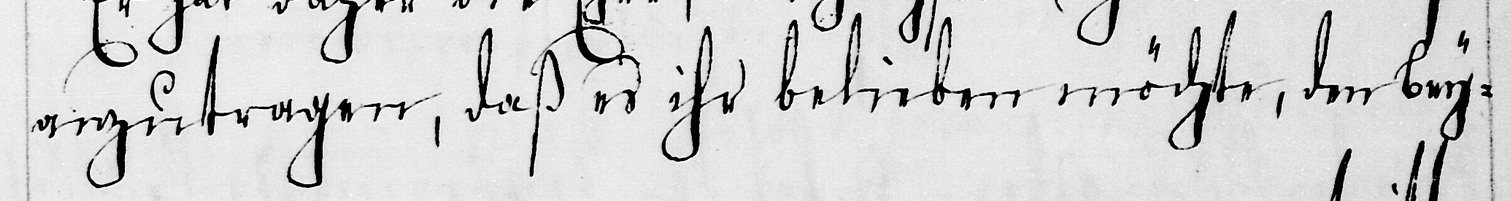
anzutragen, daß es ihr belieben möchte, den Bey-
